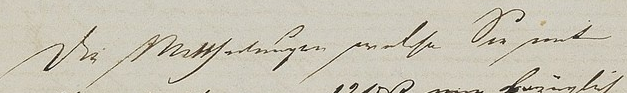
Die Mittheilungen welche Sie mit
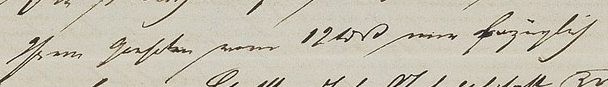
Ihrem Geehrten vom 12ten dß mir bezüglich
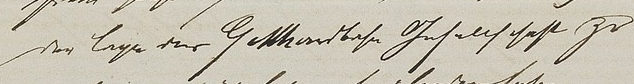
der Lage der Gotthardbahn Gesellschaft zu
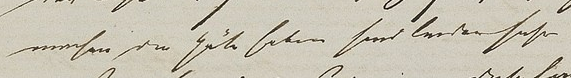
machen die Güte haben sind leider sehr
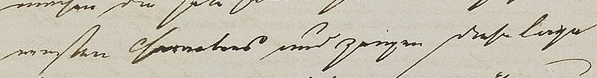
ernsten Characters und zeigen diese Lage
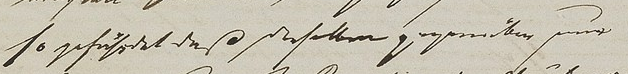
so gefährdet daß derselben gegenüber nur
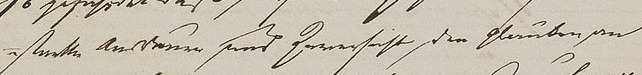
starke Ausdauer und Zuversicht den Glauben an
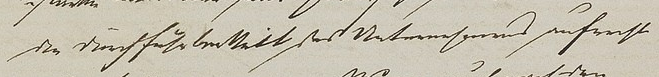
die Durchführbarkeit des Unternehmens aufrecht
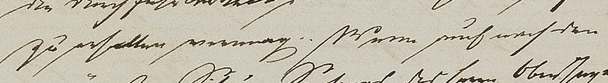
zu erhalten vermag. Wenn auch nach den
